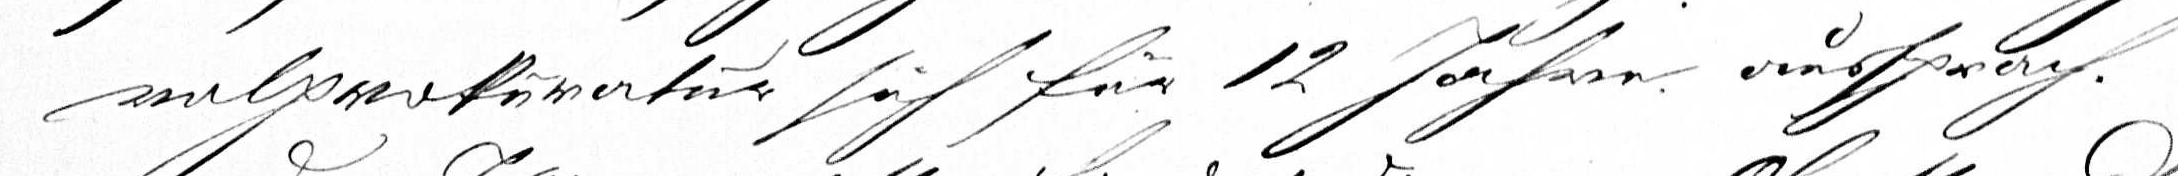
ralprokuratur sich für 12 Jahre aussprach.
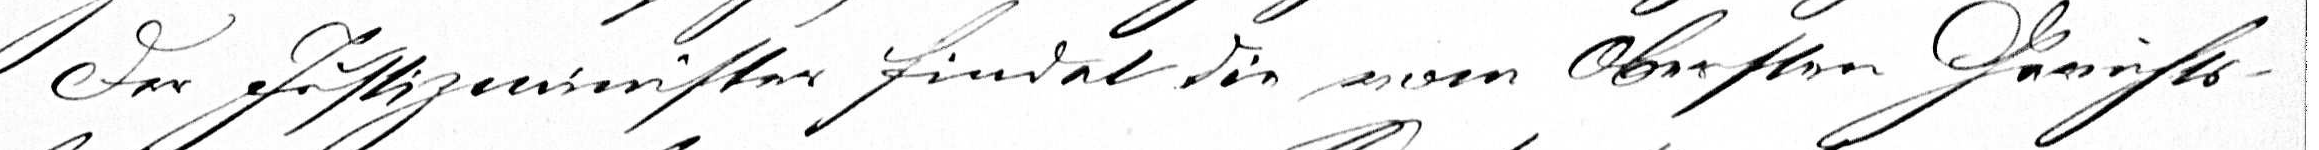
Der Justizminister findet die vom Obersten Gerichts¬
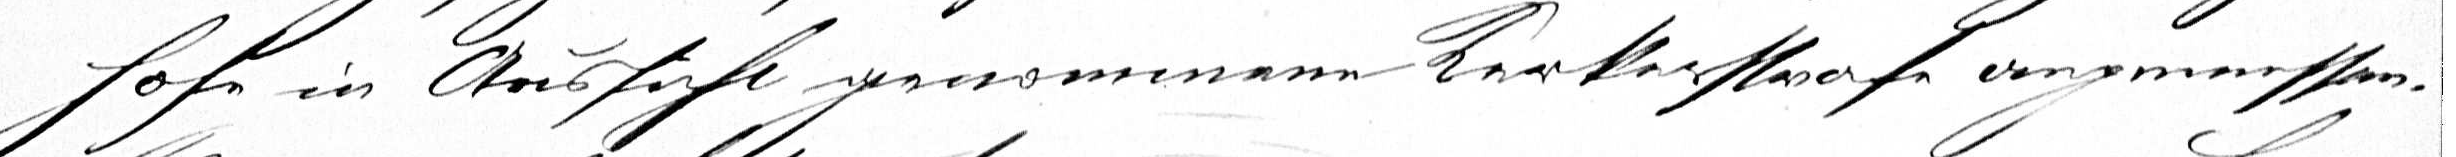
hofe in Aussicht genommene Kerkerstrafe angemessen.
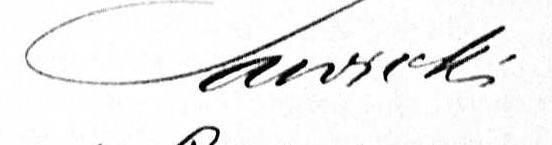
Sawicki
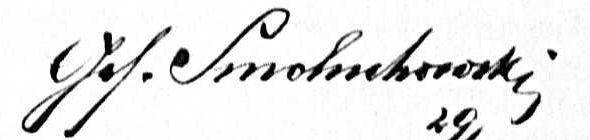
Ges. Smolnchowcki
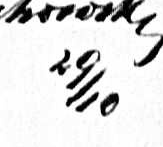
29/10
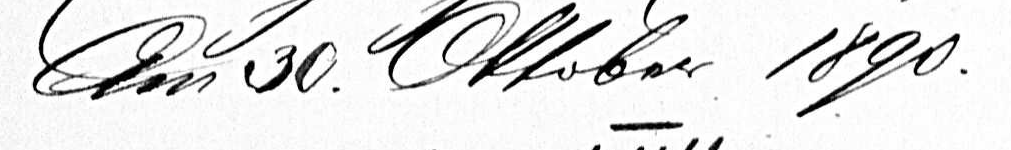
Am 30. Oktober 1890
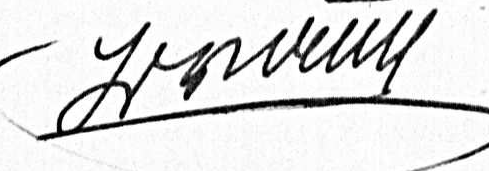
Braun
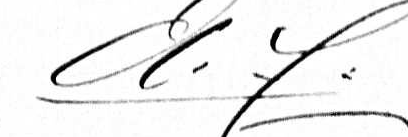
A. E:
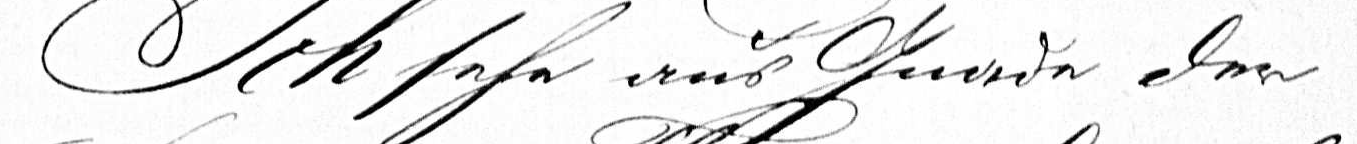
Jch sehe aus Gnade der
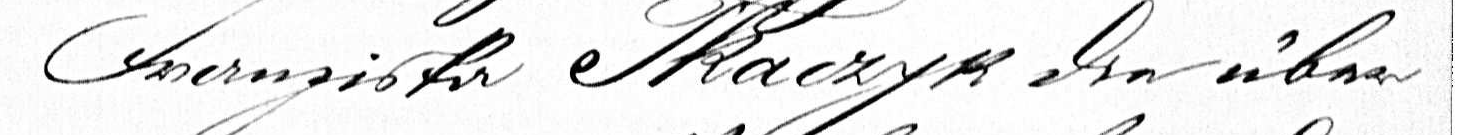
Franziska Tkaczyk die über
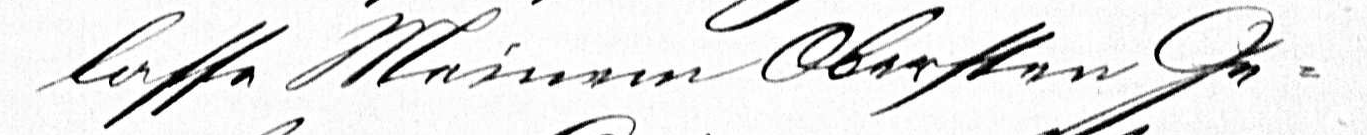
lasse Meinem Obersten Ge¬
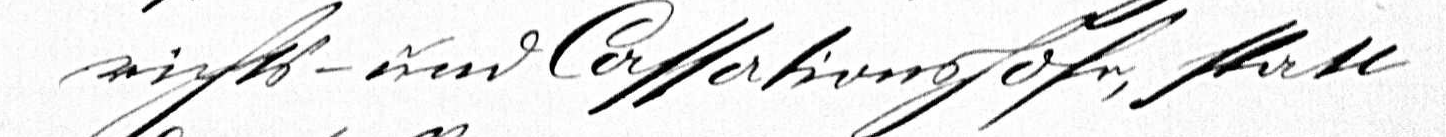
richts- und Cassationshofe, statt
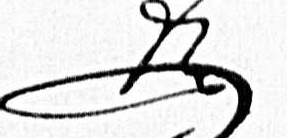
xx
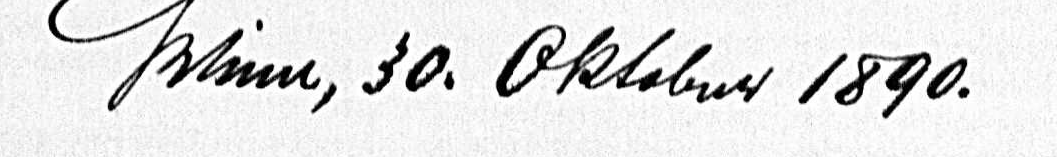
Wien, 30. Oktober 1890.
